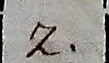2.
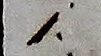1.
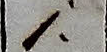1.
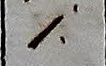1.
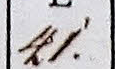41.
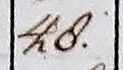48.
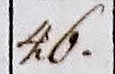46.
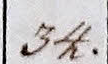34
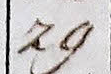29
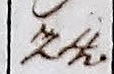24
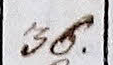36.
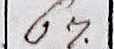67.
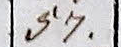57.
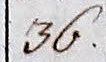36
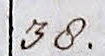38
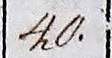40.
